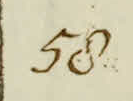58
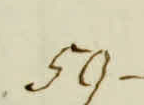59
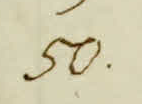50.
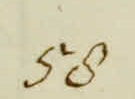58
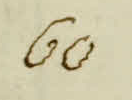60
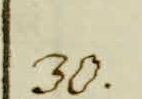30.
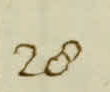28
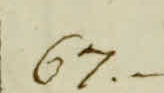67.
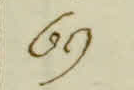69
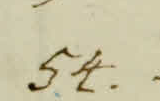54.
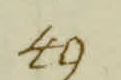49
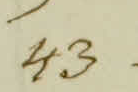43
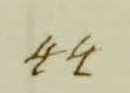44
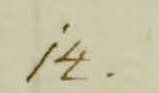14.
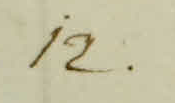12.
